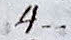4
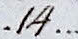14
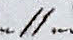11
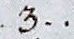3
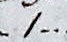1
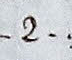2
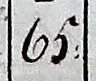65
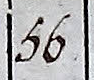56
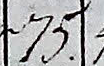75.
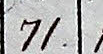71.
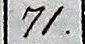71
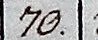70.
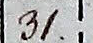31.
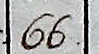66
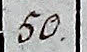50
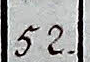52
